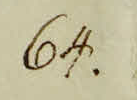64.
